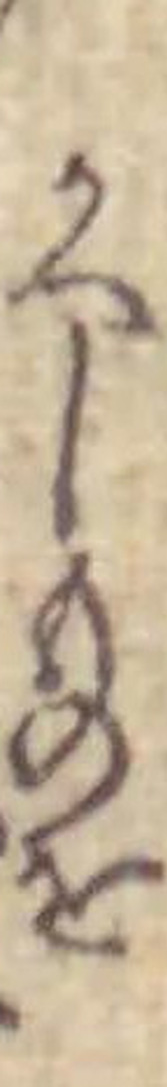かへしものを
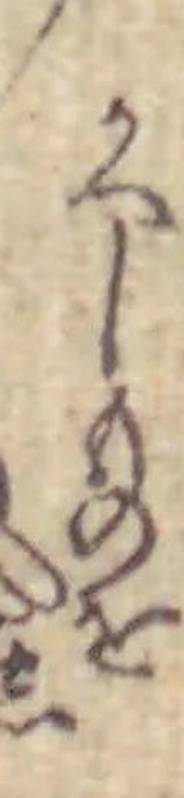かへしものを
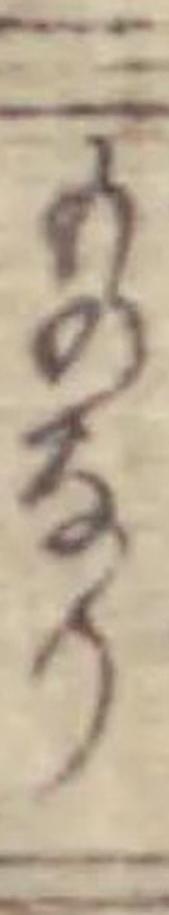ものなり

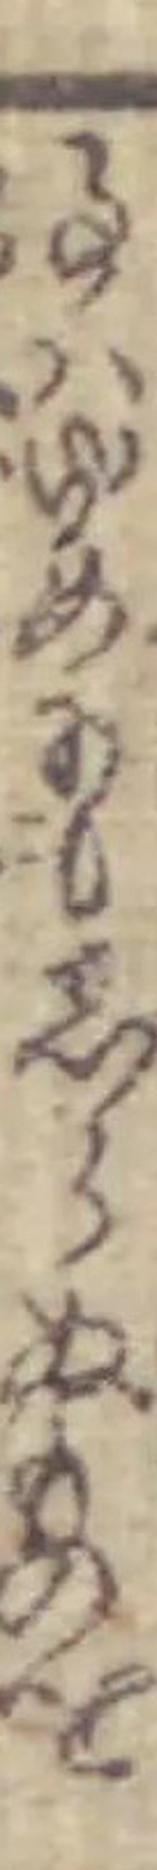事はゆめにもしらぬものを
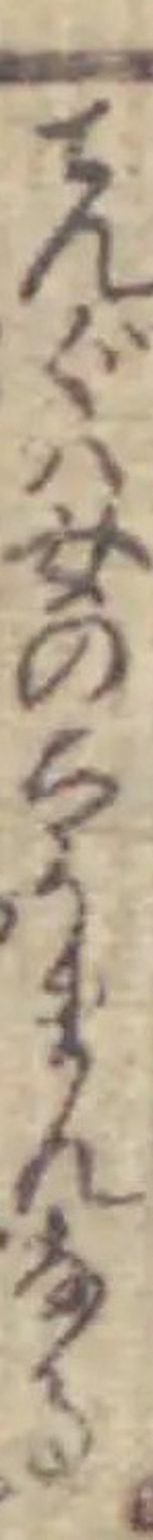てんぐは女のこうまんなる
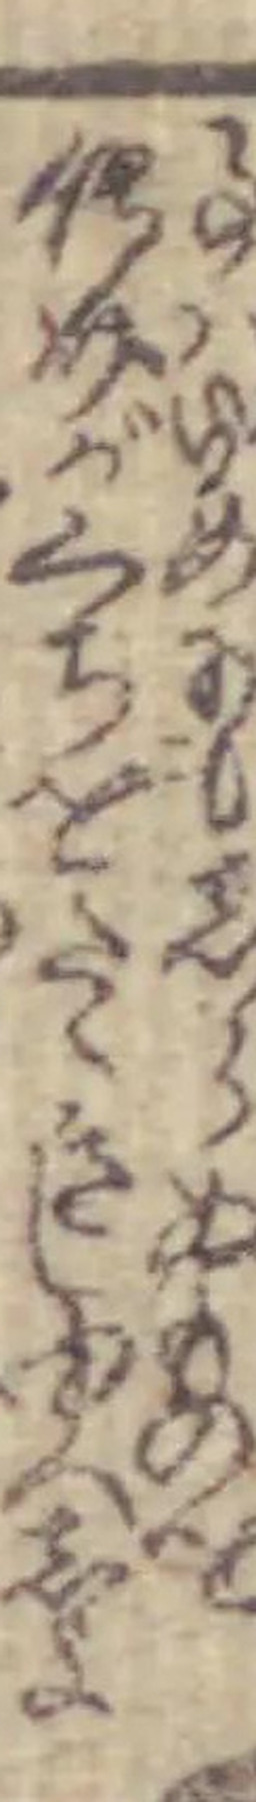伝介がくちをたゝきしゆへしよ
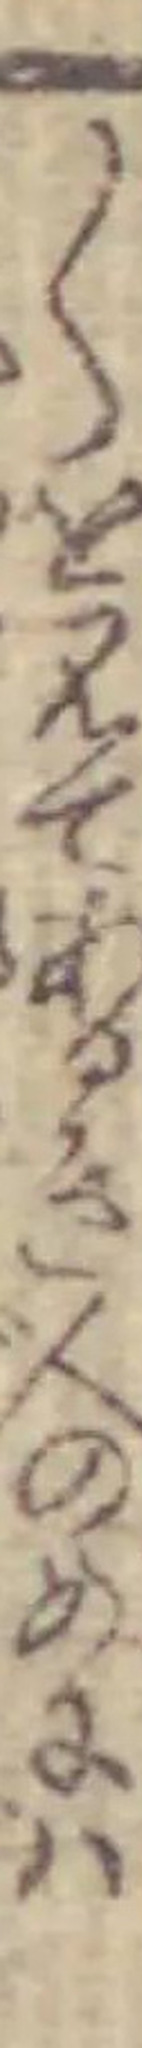〳〵を見てあるき人のめには
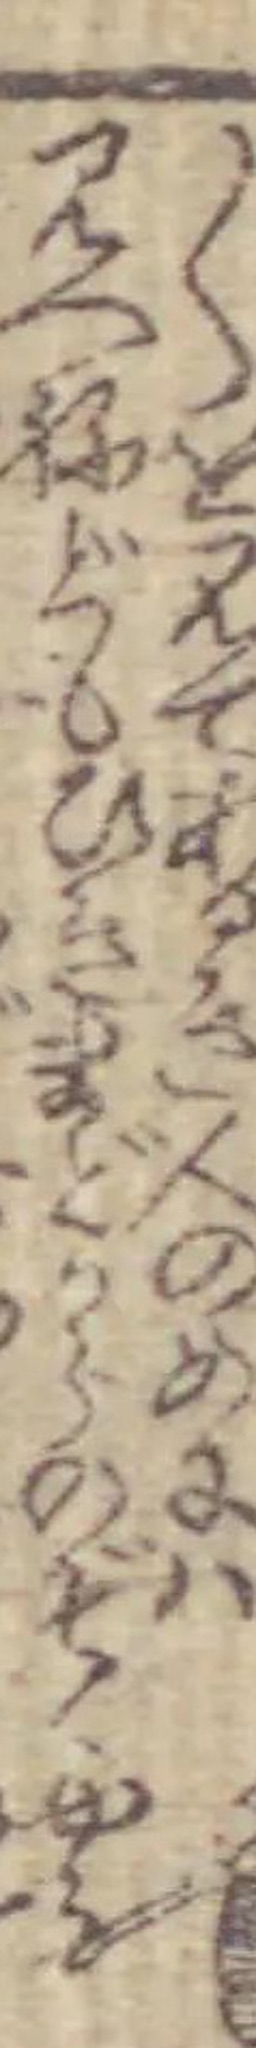見へねどもひきまどからのぞくやら
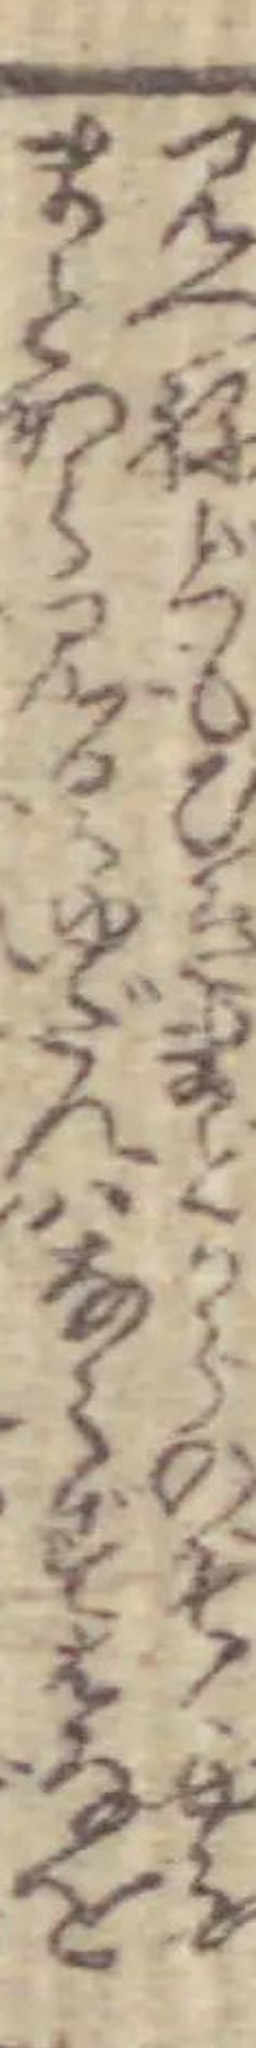まとから見るかゆだんはならずはなを
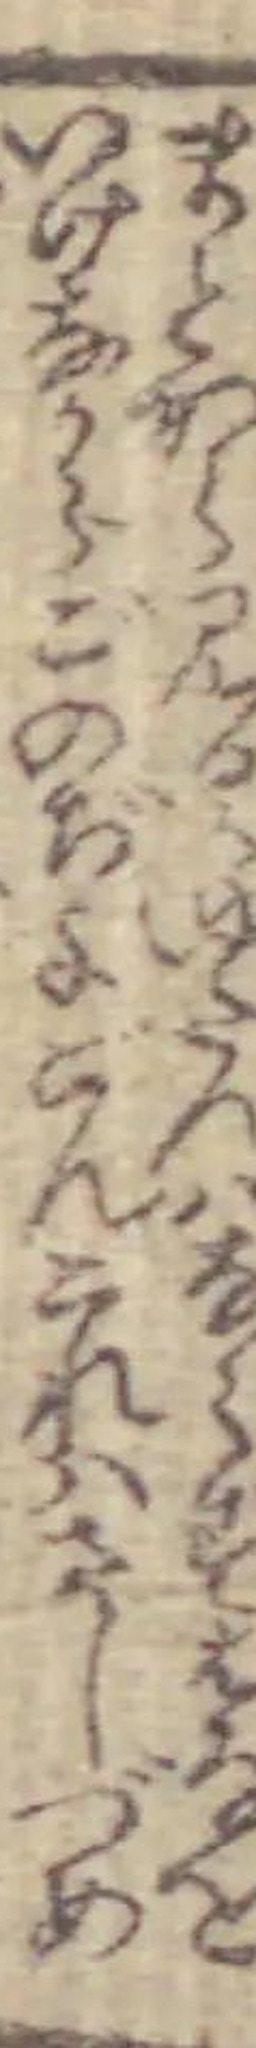つけなからごのぢよごんこれはさしづめ
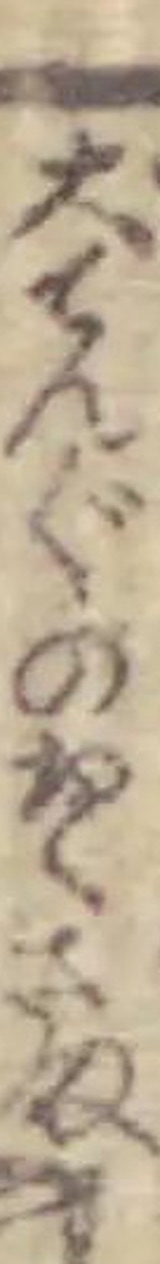大てんぐのおくさま
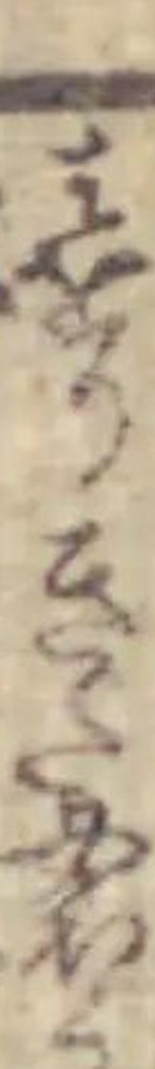はをりきたやほう
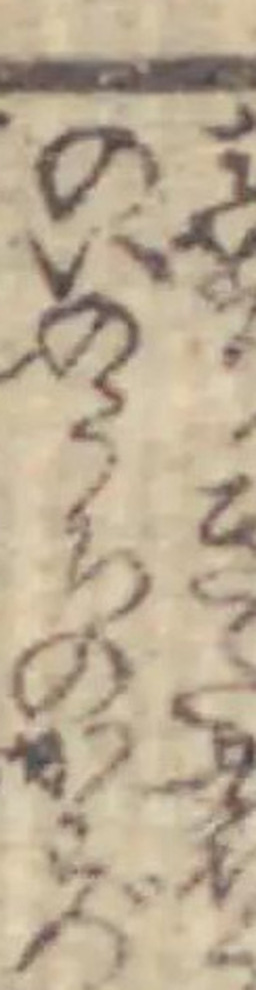のいのうちのかわづ
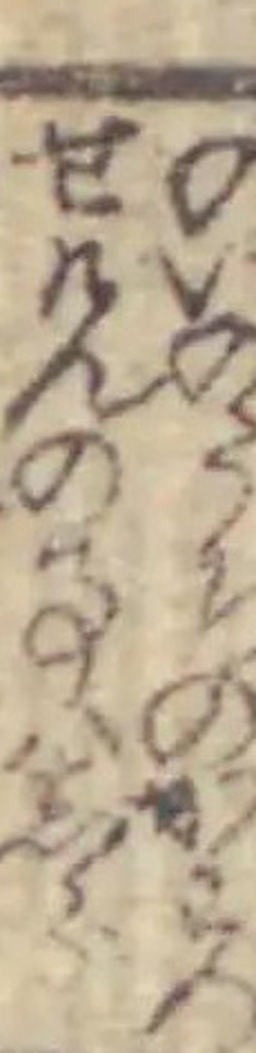せけんの事はしら
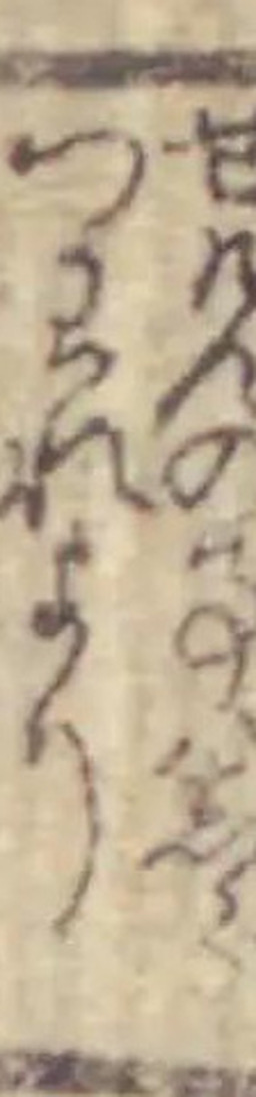づわれより
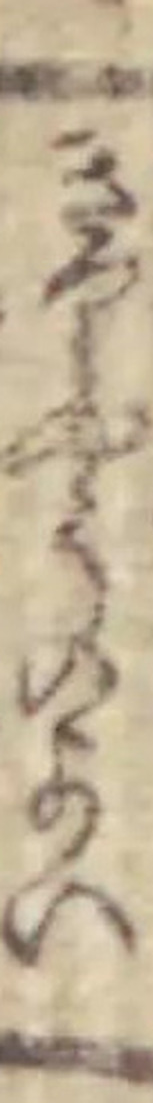きつしやうのよい
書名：珍説女天狗 2巻
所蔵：国立国会図書館 National Diet Library, JAPAN
